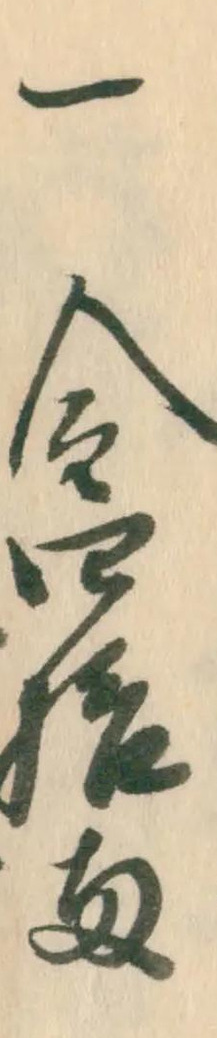一金四拾両
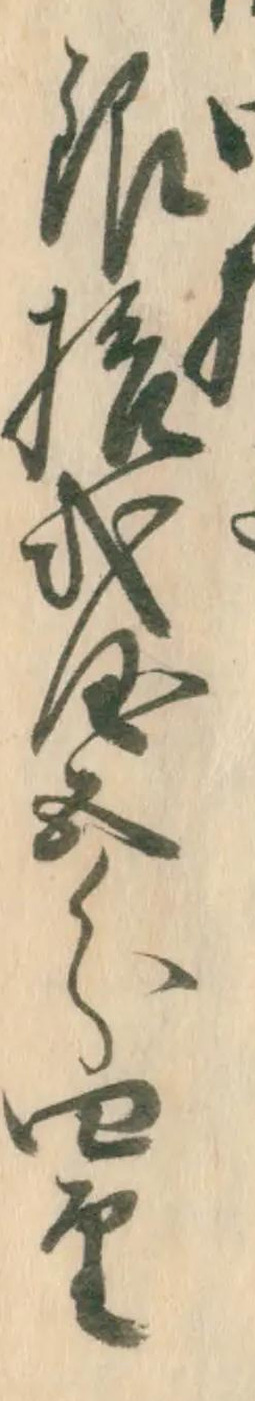銀拾弐匁五分四厘

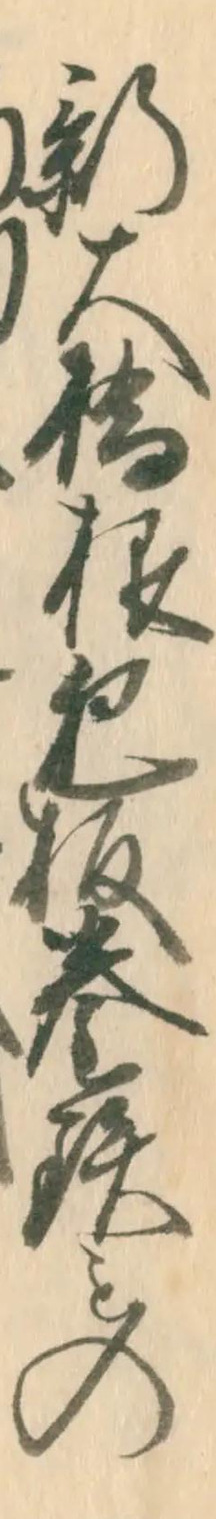新大橋根包板巻鉄もの
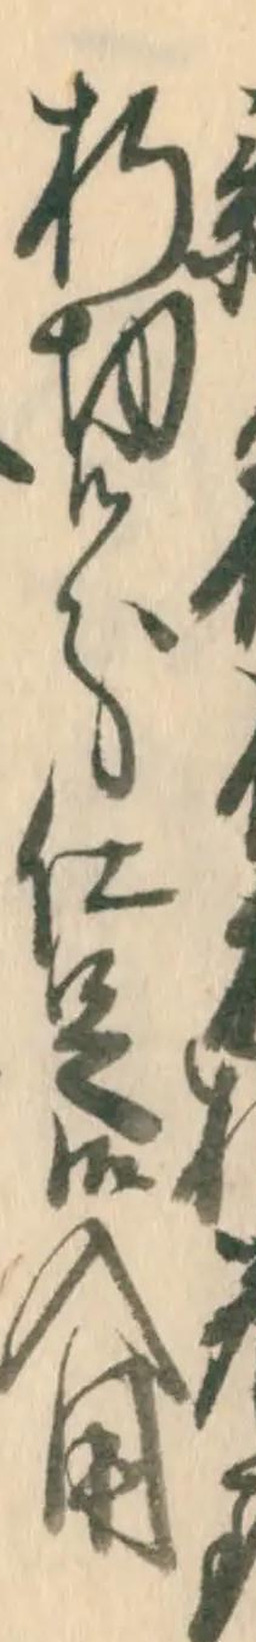朽切候分仕足御入用
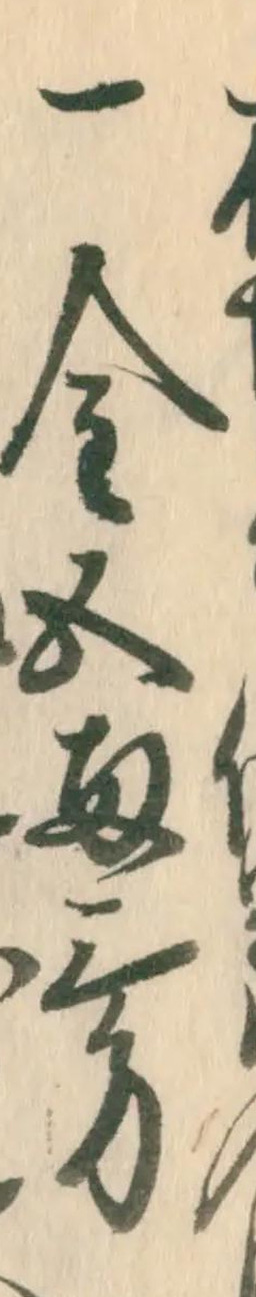一金五両三分
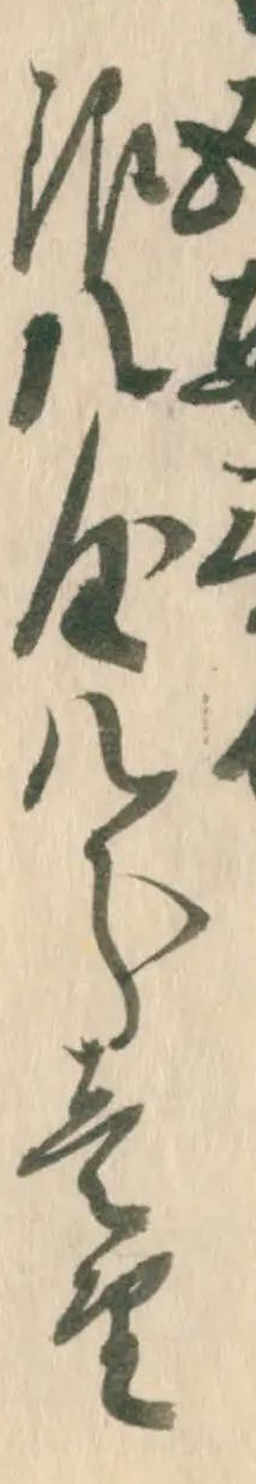銀八匁八分壱厘
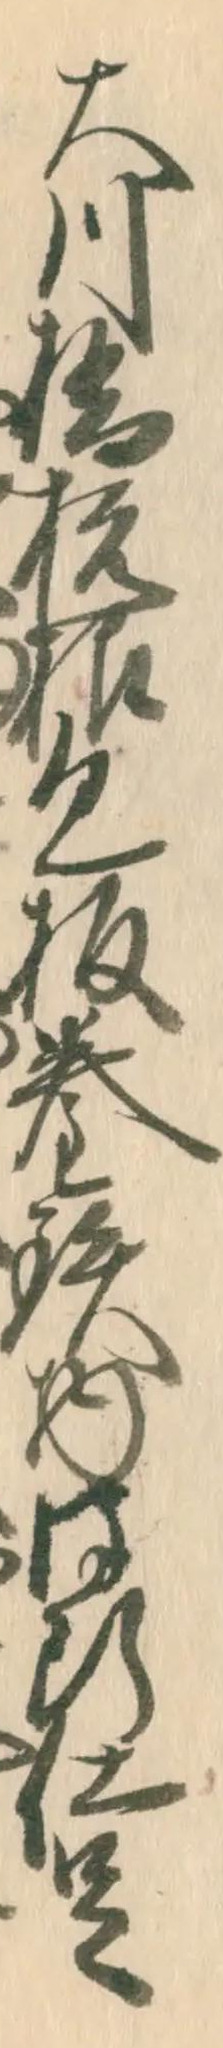大川橋杭根包板巻鉄物同断仕足
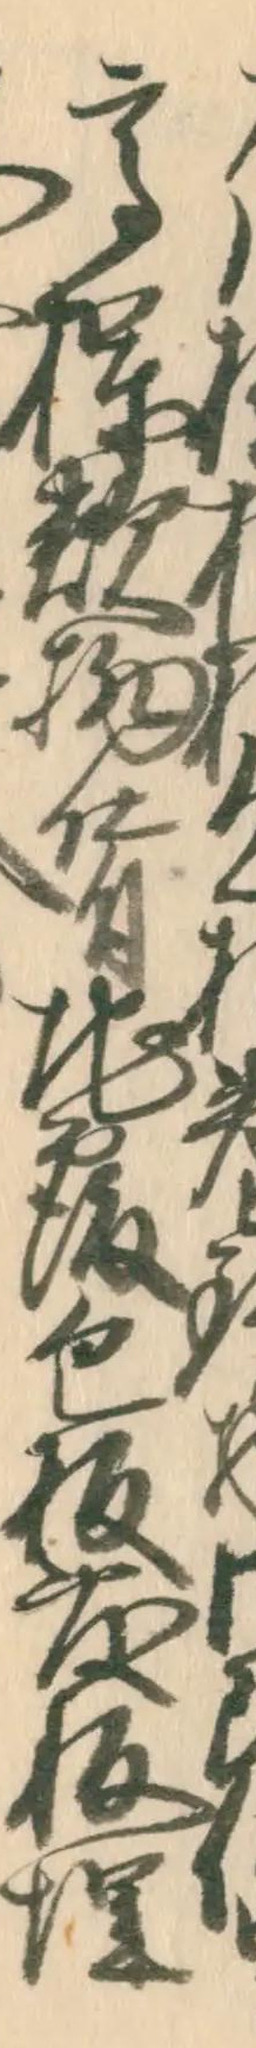高欄頬柄仕付地覆包板敷板埋
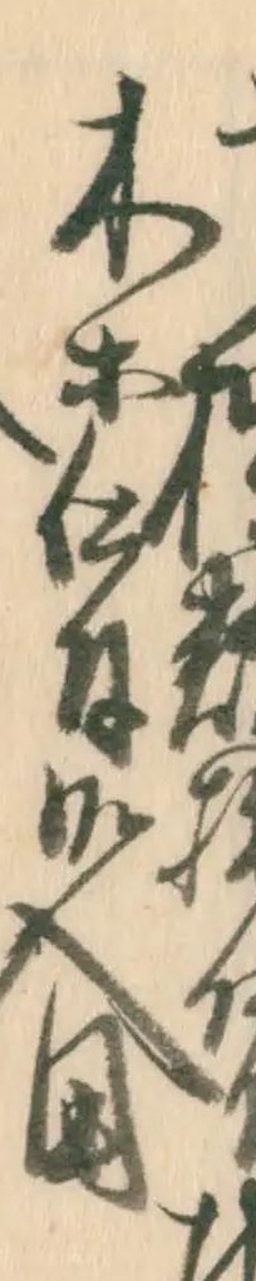木等仕付御入用
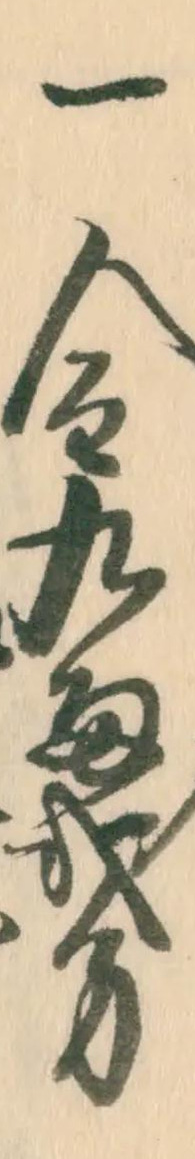一金九両弐分
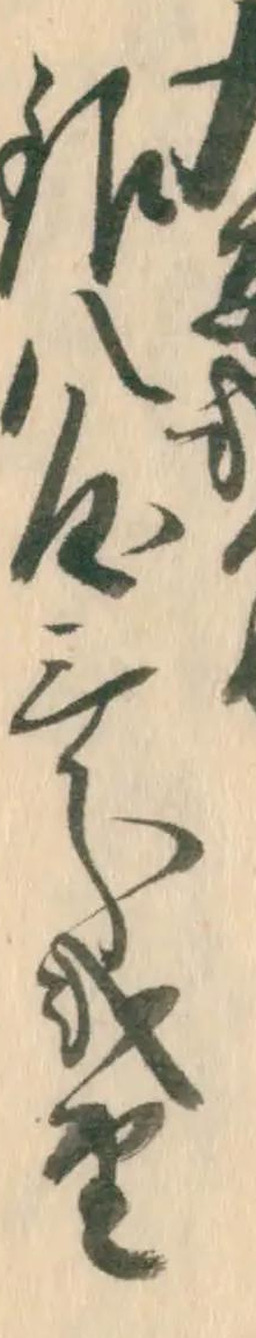銀八匁三分弐厘
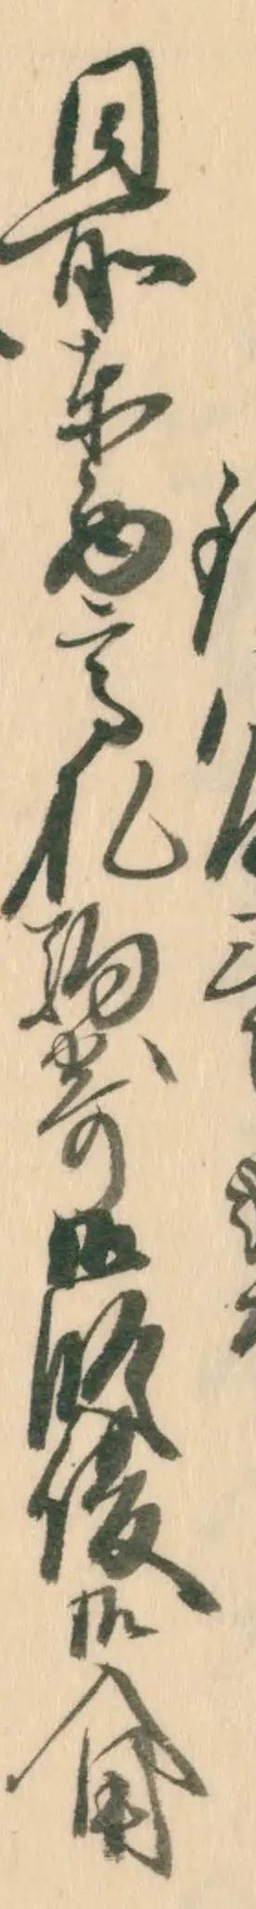同所東西高札駒寄御修復御入用
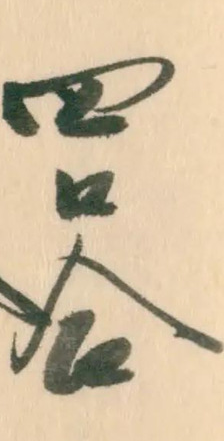四口合
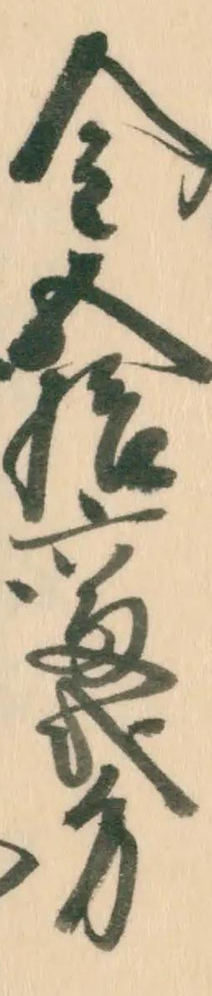金五拾六両弐分
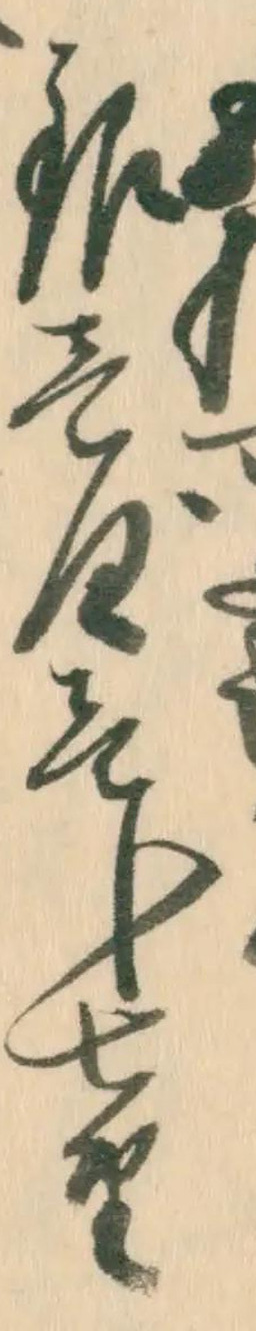銀壱匁壱分七厘
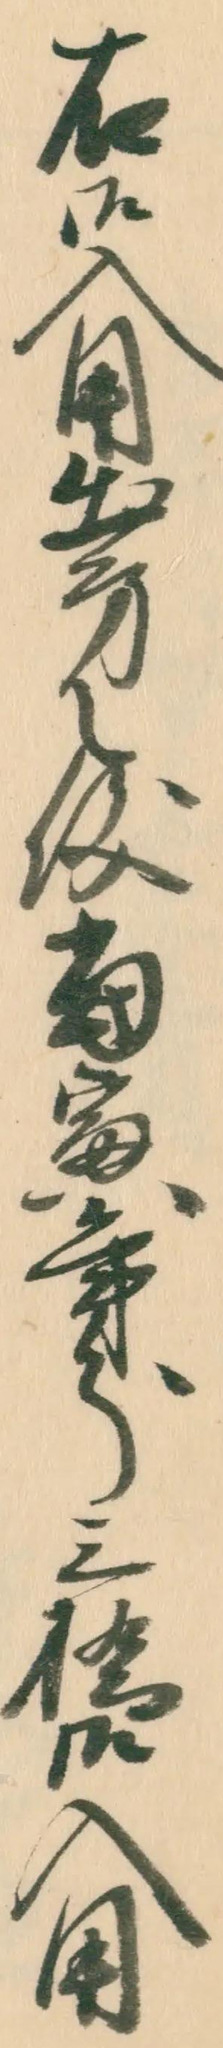右御入用出方之儀当寅年分三橋御入用
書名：三橋 17巻. [8] 三橋小破御修復書留　但御奉行御掛リ替地震潰橋番屋　嘉永四亥年より安政二卯年迄　下
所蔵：国立国会図書館 National Diet Library, JAPAN
